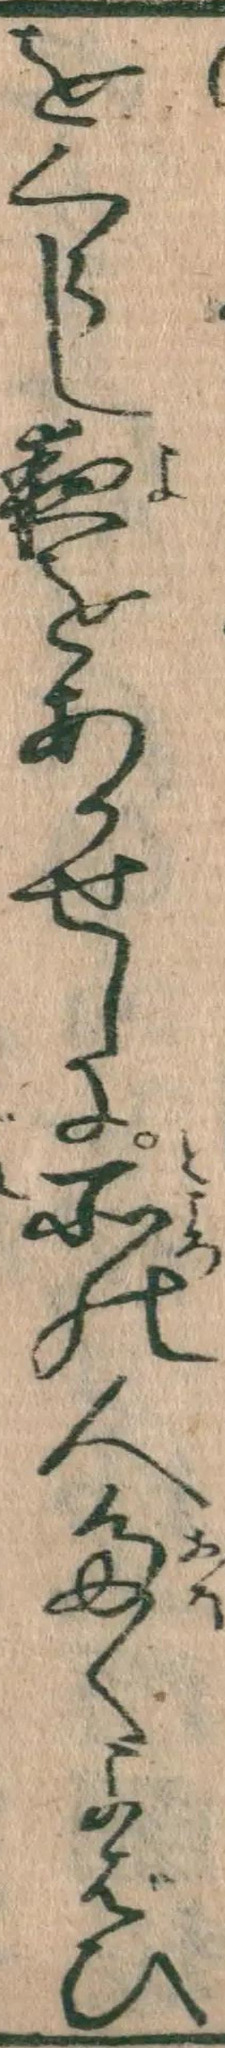をくらし夜をあかせしに。所の人多くよばひ
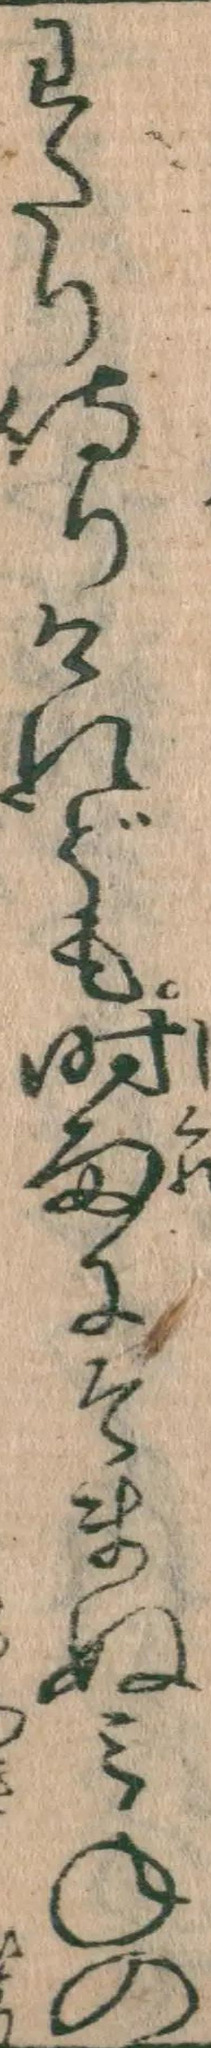わたり侍りけれども。時雨にそまぬみねの
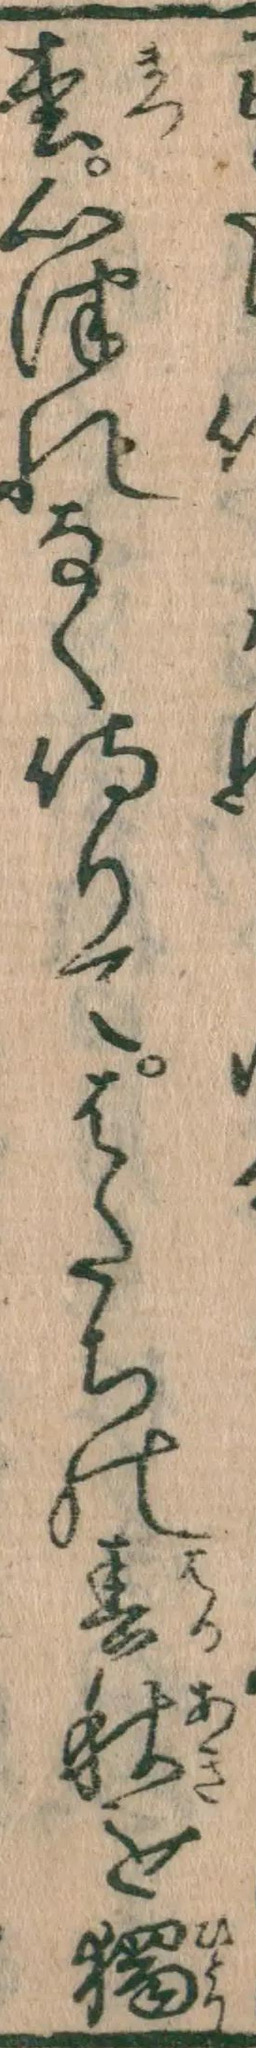松。心つれなく侍りて。はたちの春秋を独
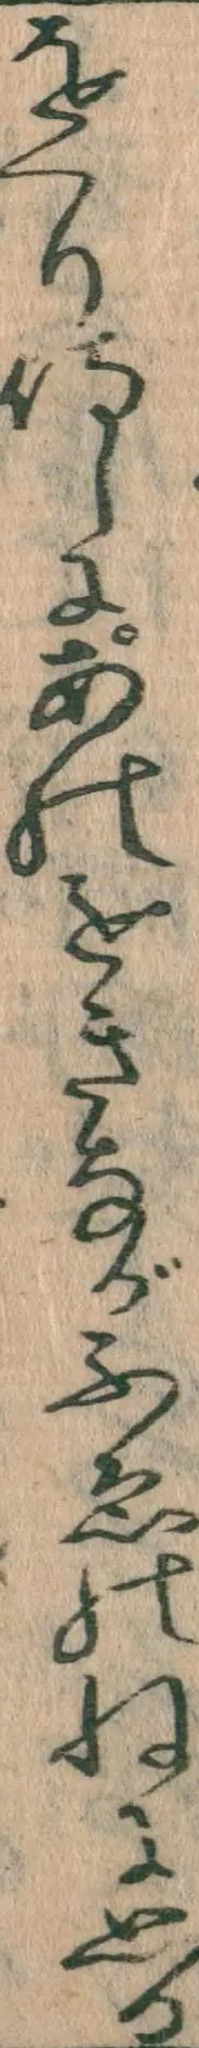をくり侍しに。あのをきながふゑのねに思ひ
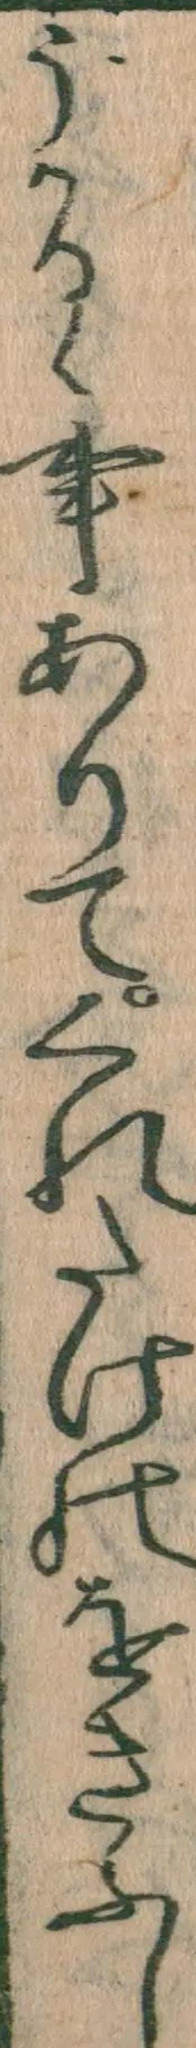うかるゝ事ありて。くれたけのをきふし
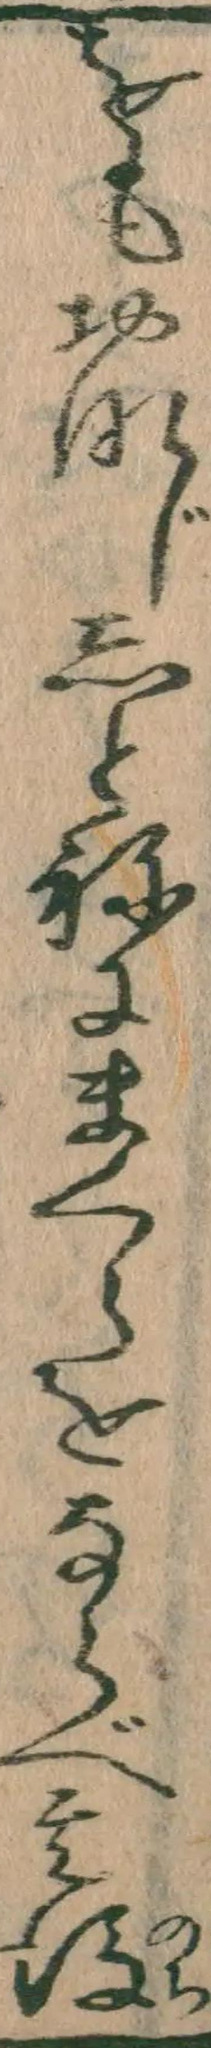をもおなじしとねにまくらをならべ其後
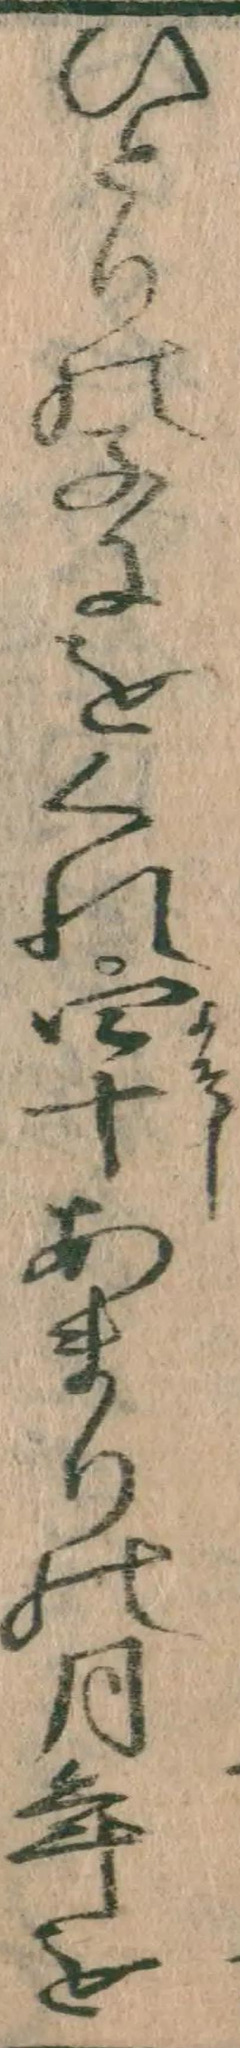ひとりの子にをくれ。四十あまりの月年を
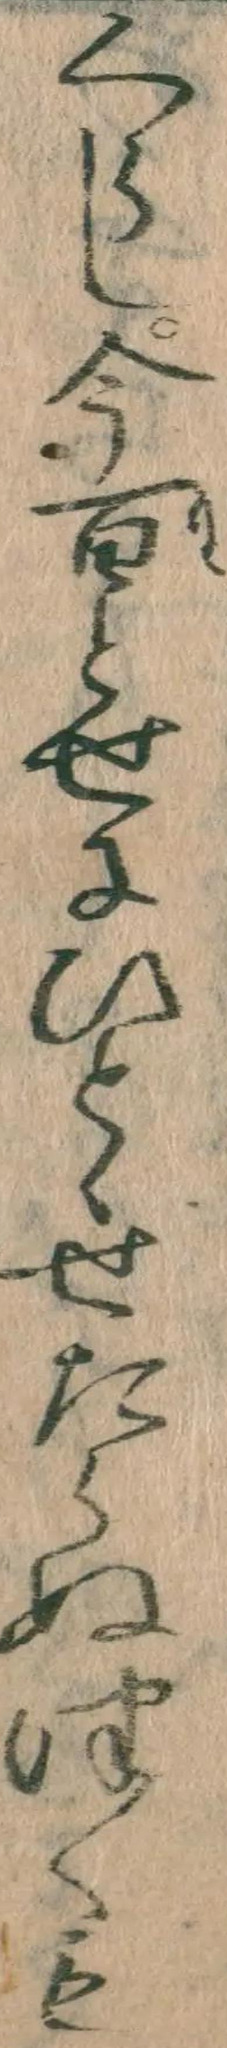くらし。今百とせにひとゝせたらぬつくも
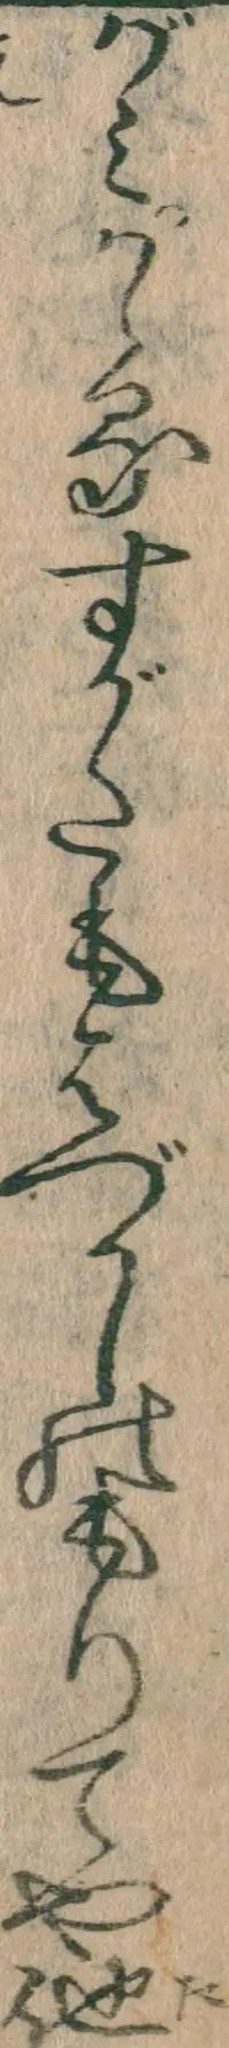がみ。かゝるすがたもはづかしのもりてや他
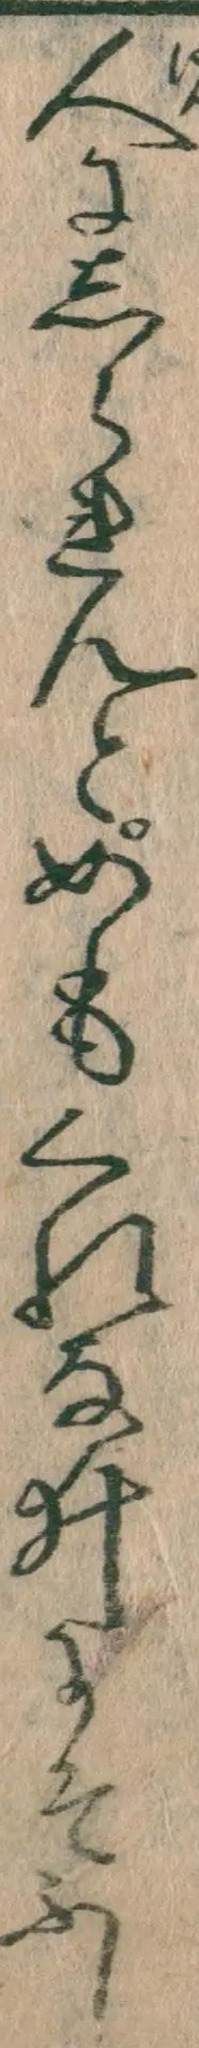人にしられんと。めもくれなゐにそふし
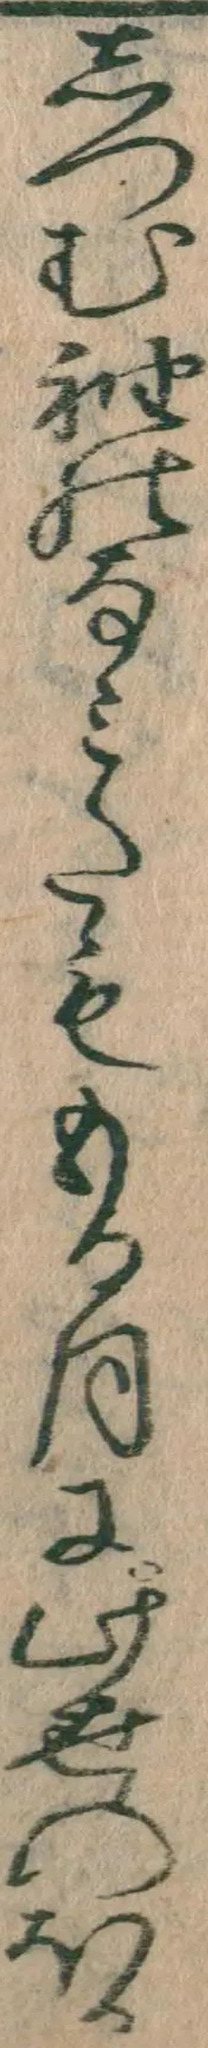しつむ神のなみたももる月に。此世のほか
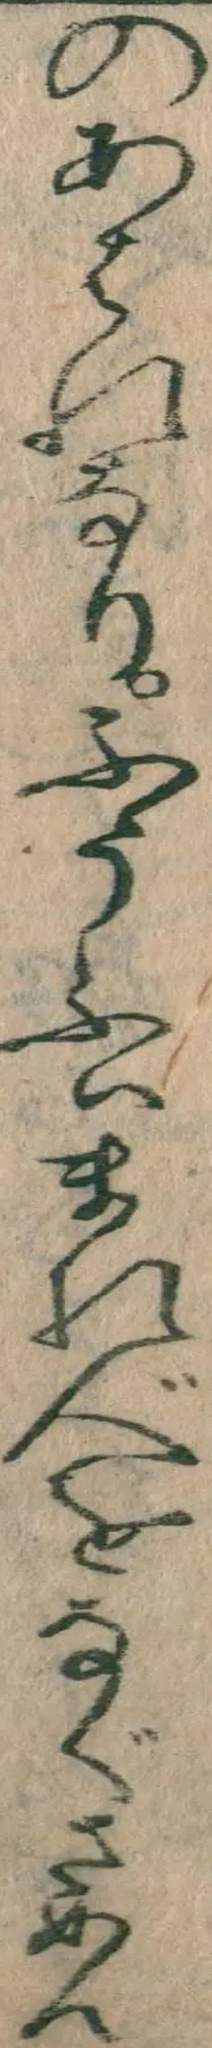のあはれなり。ふうふはまれ”人をなぐさめん
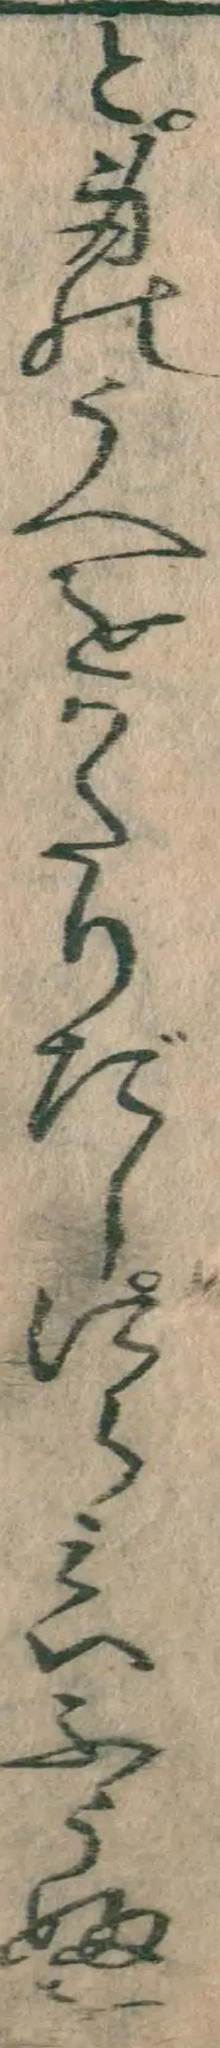と。身のうへをかたりだし。にらみはふうふを
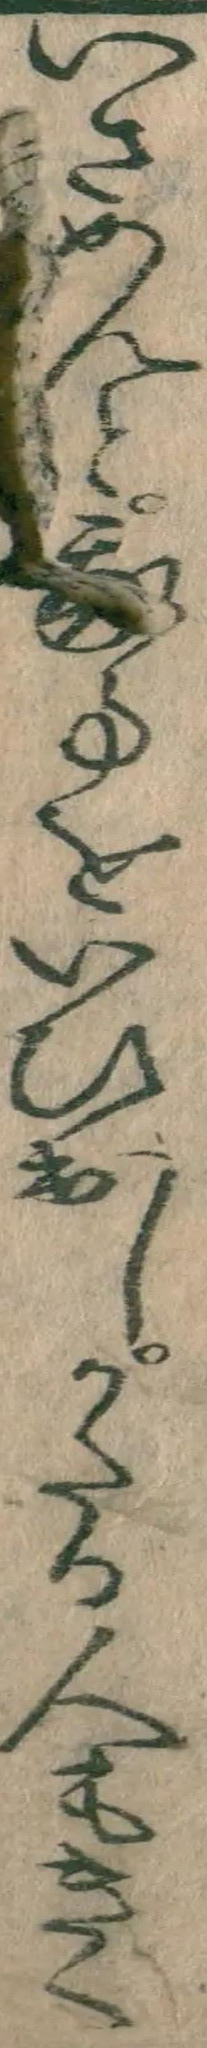いさめんと。我事をいひ出し。かたる人もきく
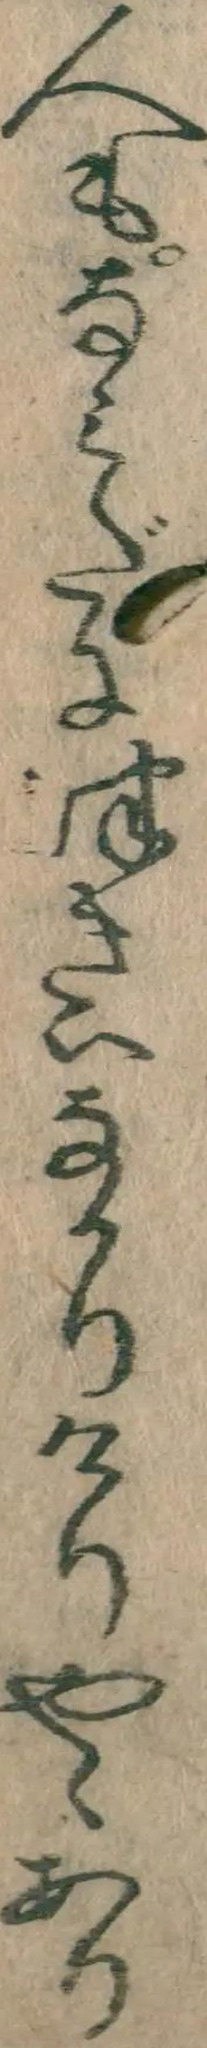人も。なみだにつきはなかりけりやゝあり

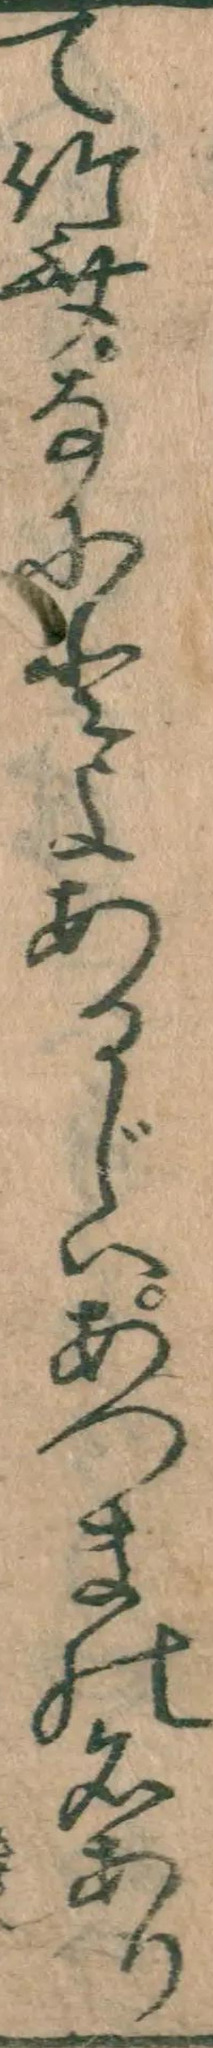て竹斎、なにとよあるじは。あつまの名あり
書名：竹斎狂歌物語 3巻
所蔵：国立国会図書館 National Diet Library, JAPAN
